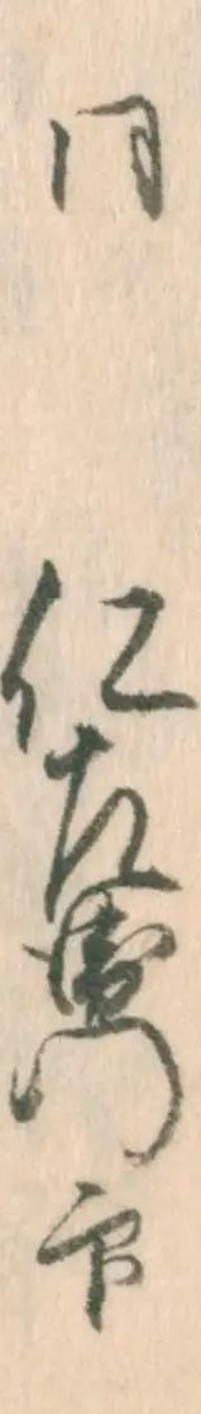同仁左衛門印
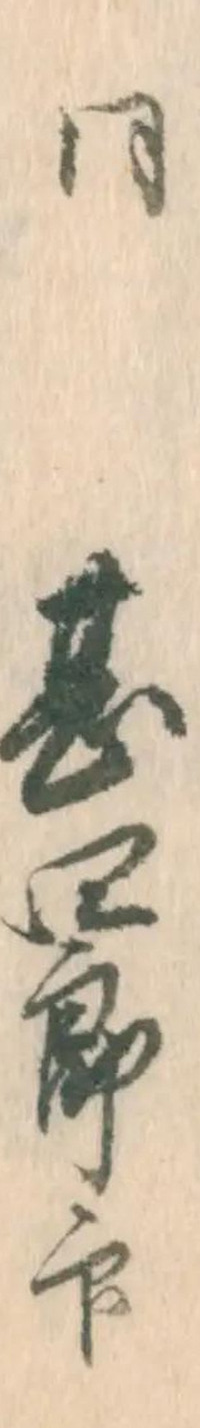同甚四郎印
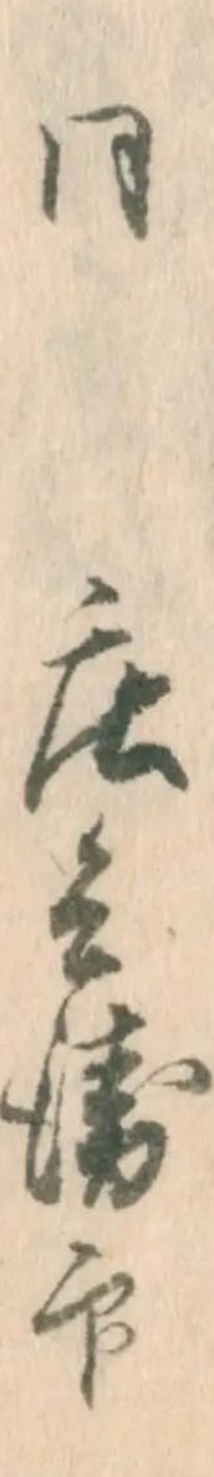同庄兵衛印

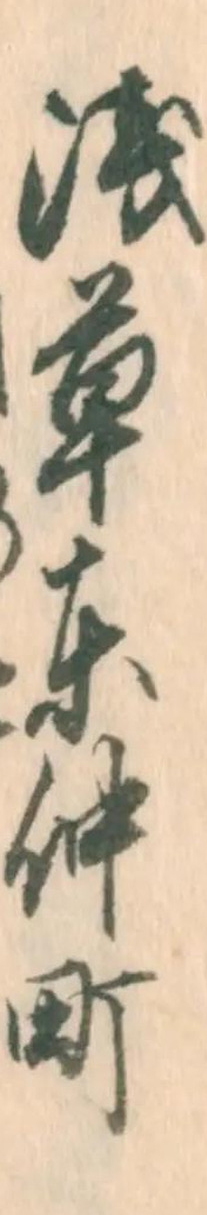浅草東仲町
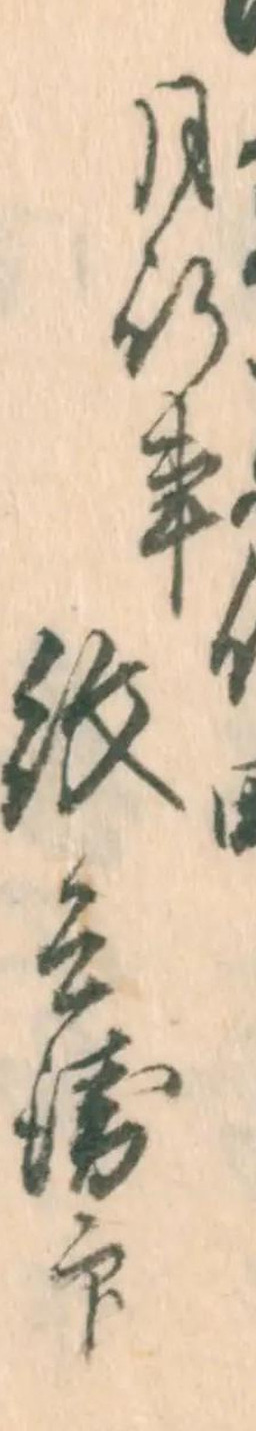月行事紋兵衛印
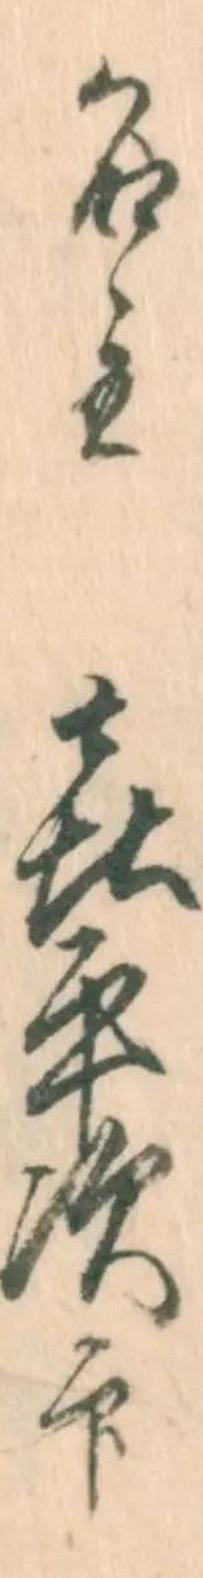名主喜平次印
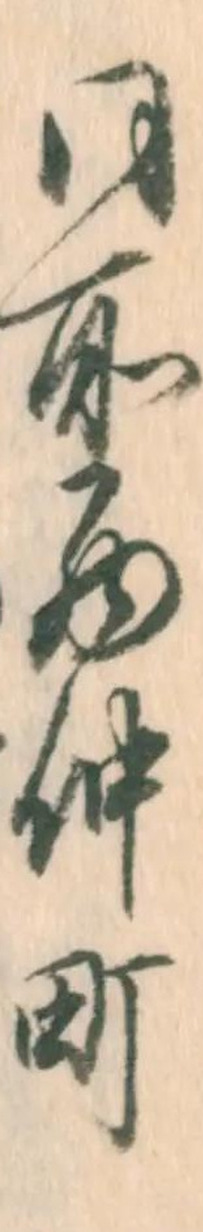同所西仲町
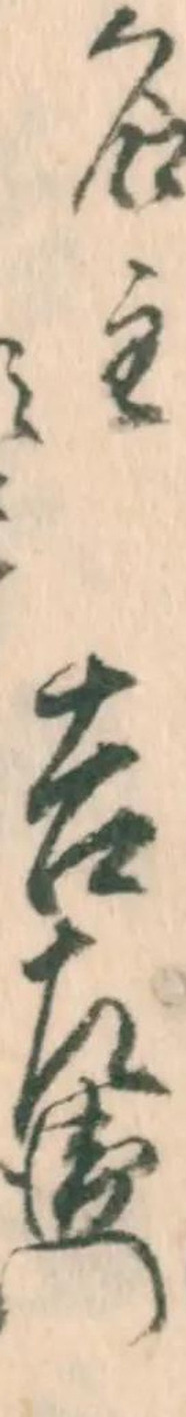名主吉左衛門
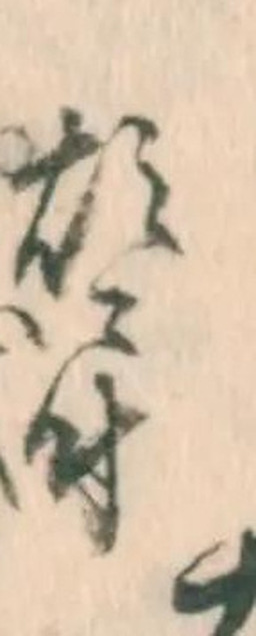煩ニ付
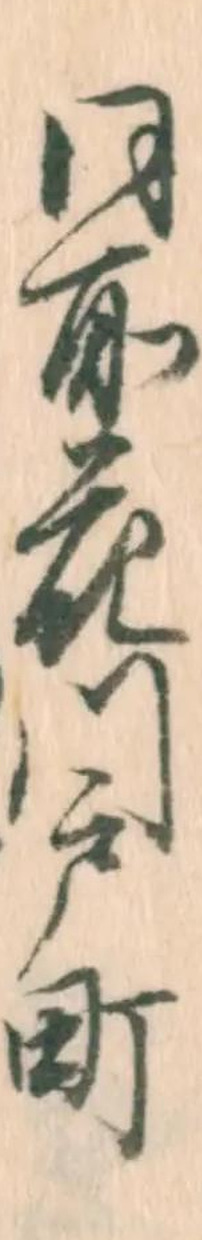同所花川戸町
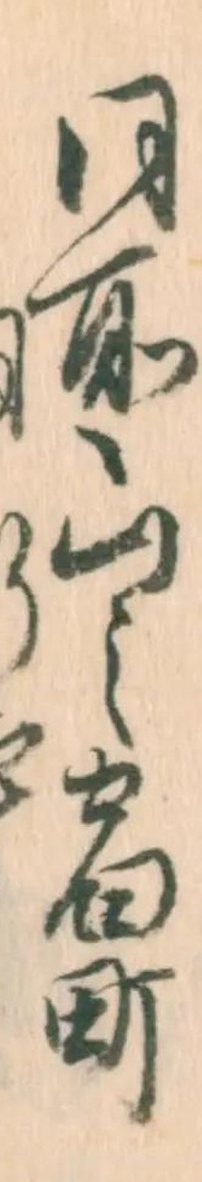同所山之宿町
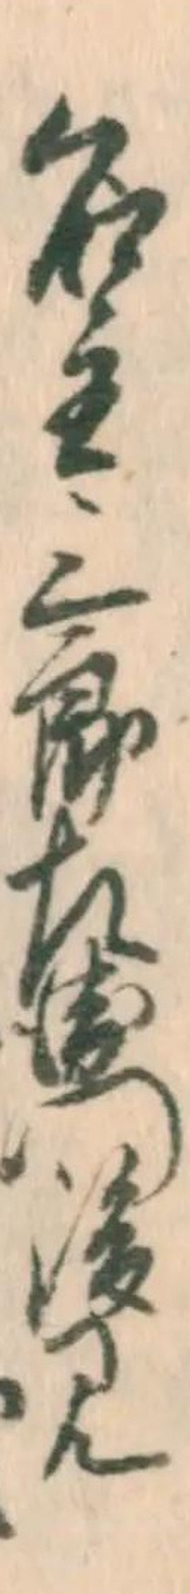名主三郎左衛門後見
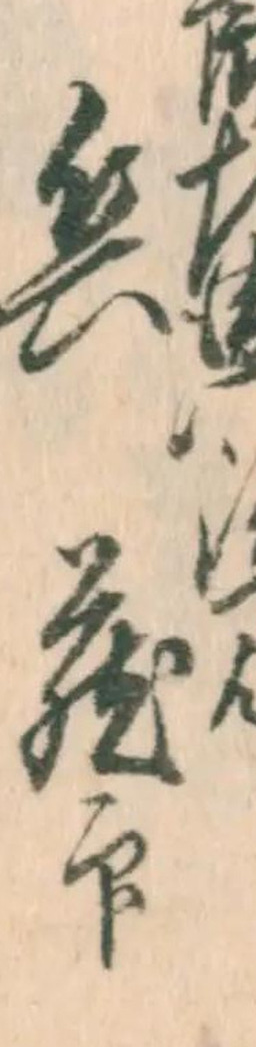兵蔵印
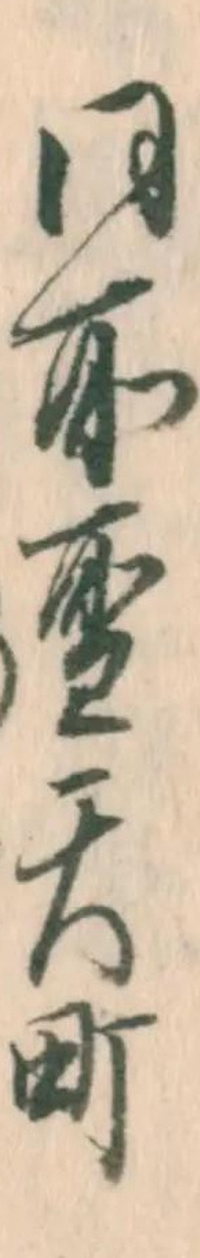同所聖天町
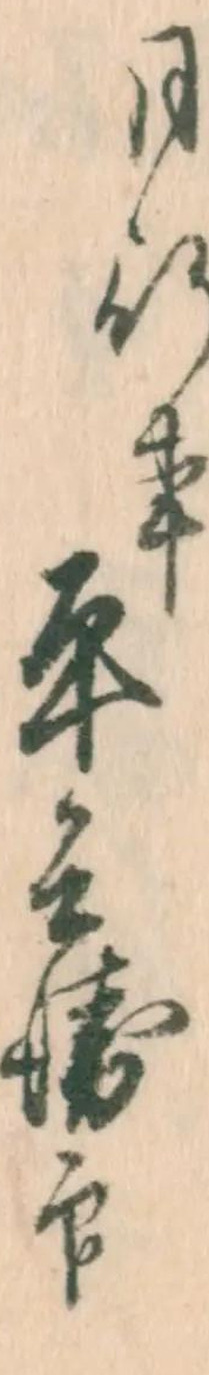月行事平兵衛印
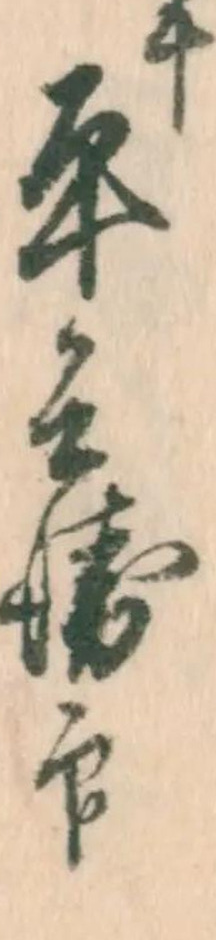月行事平兵衛印
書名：地震災書留 2巻. [2] 内表紙に「地震一件　安政二卯年十月」とあり
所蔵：国立国会図書館 National Diet Library, JAPAN
